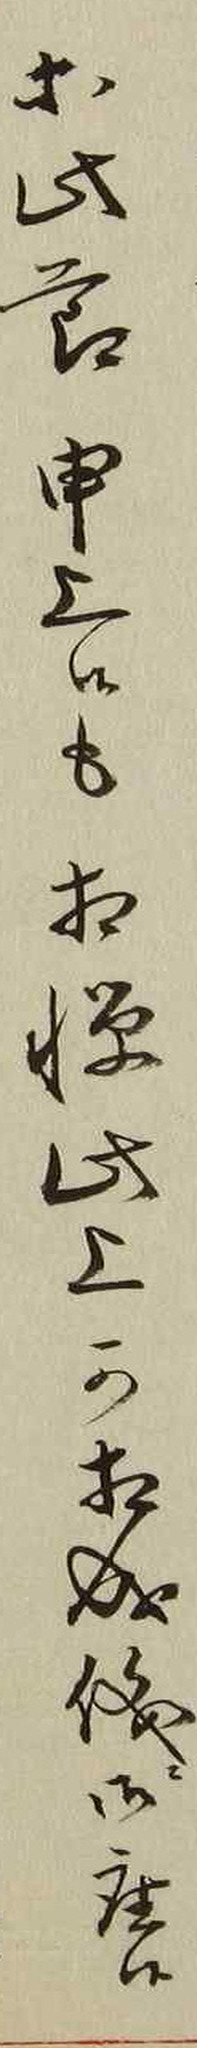等此節申上候も相憚此上可相成儀御座候
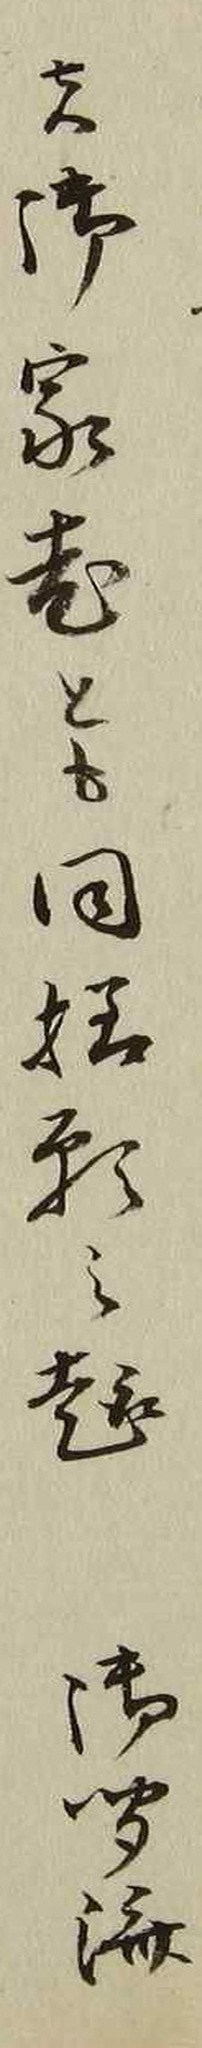は御家老とも同様願之趣御聞済
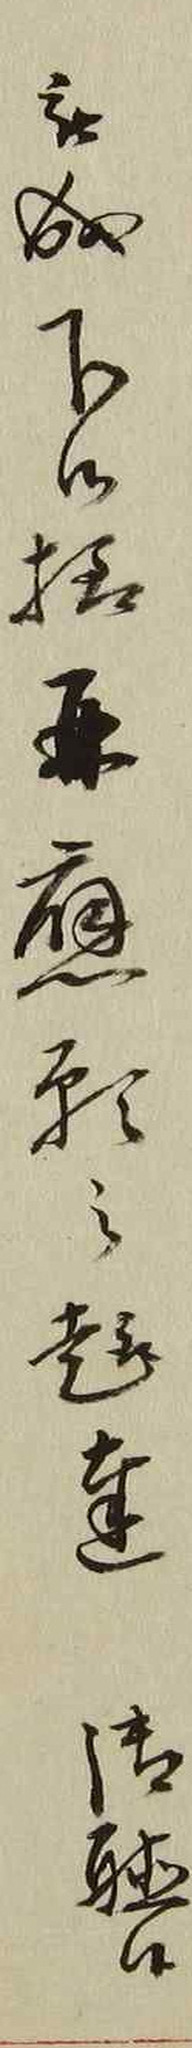被成下候様再応願之趣達御聴候
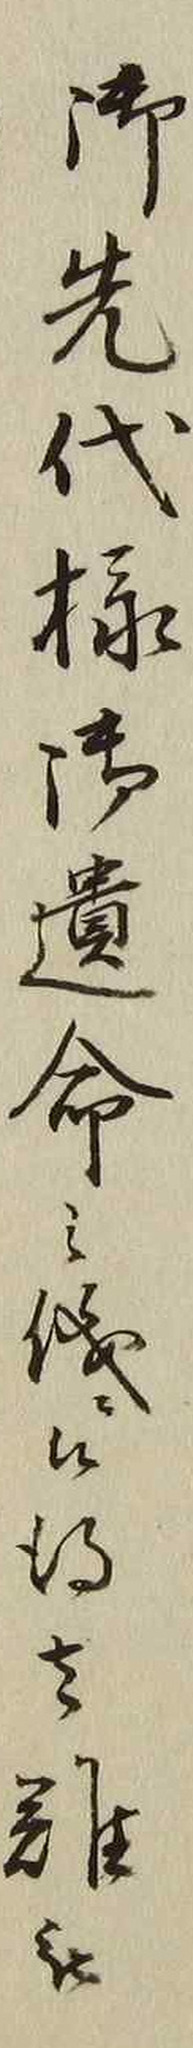御先代様御遺命之之儀に候得は難被
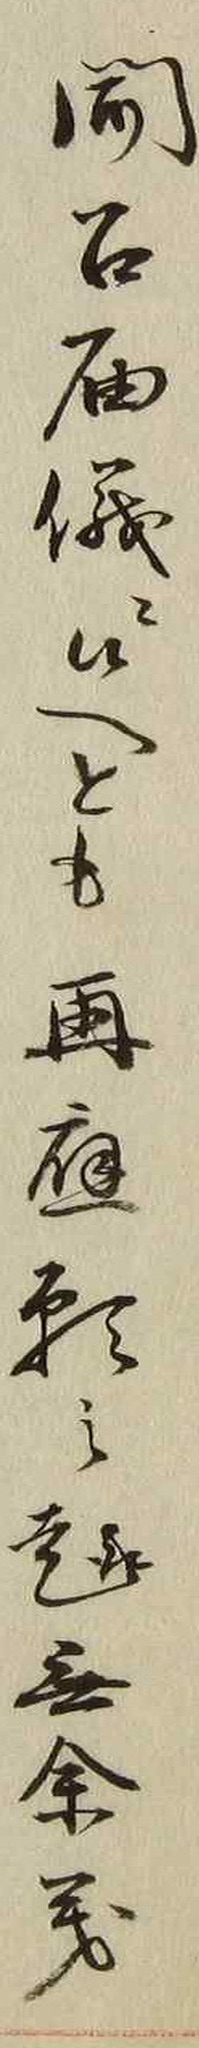聞召届儀に候へとも再応願之趣無余儀
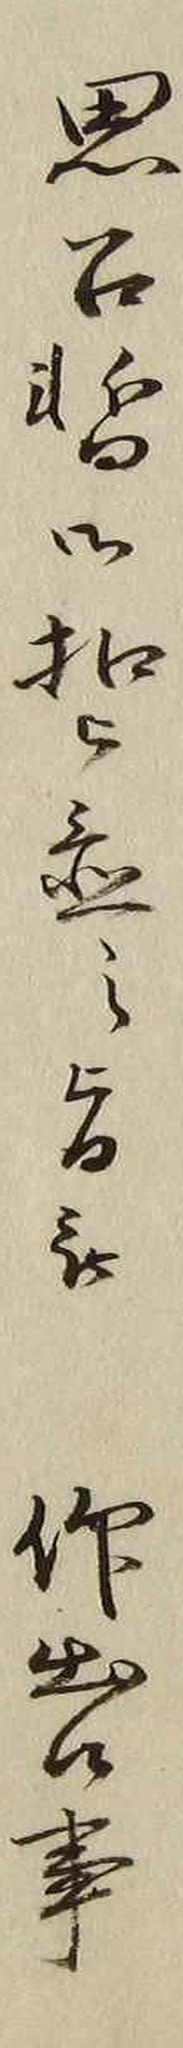思召暫御扣被置之旨被仰出候事
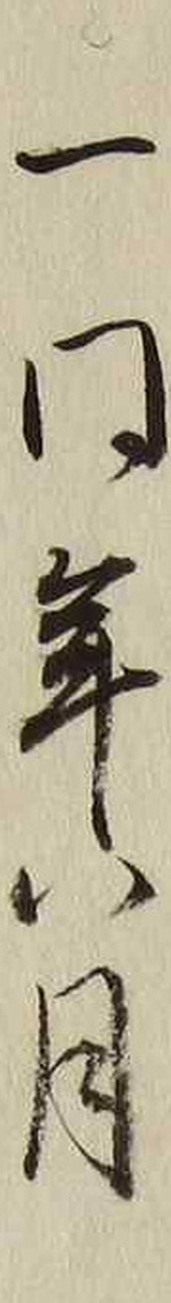一同年八月
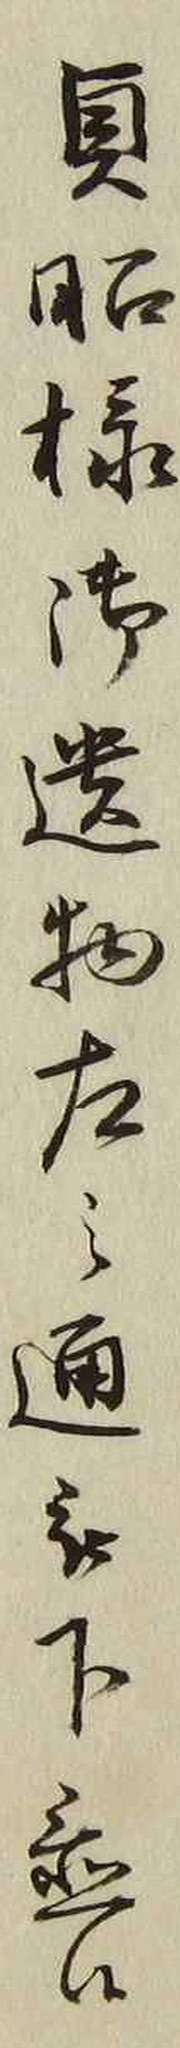貞昭様御遺物左之通被下置候
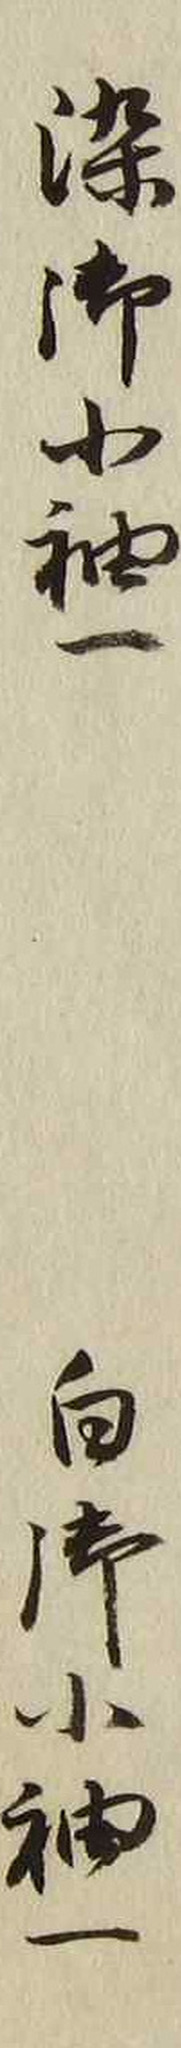染御小袖一白御小袖一
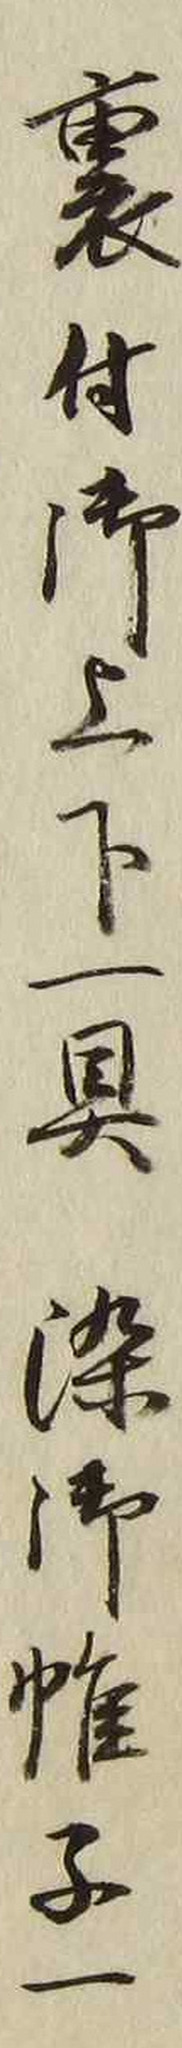裏付御上下一具染御帷子一
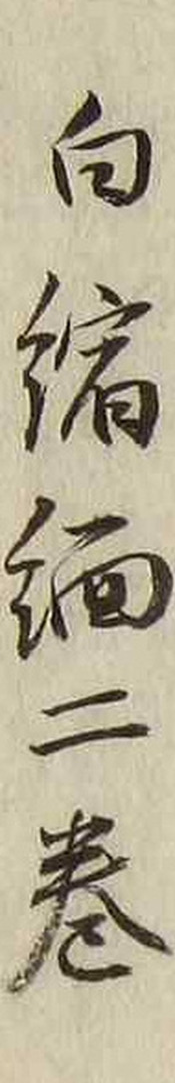白縮緬二巻
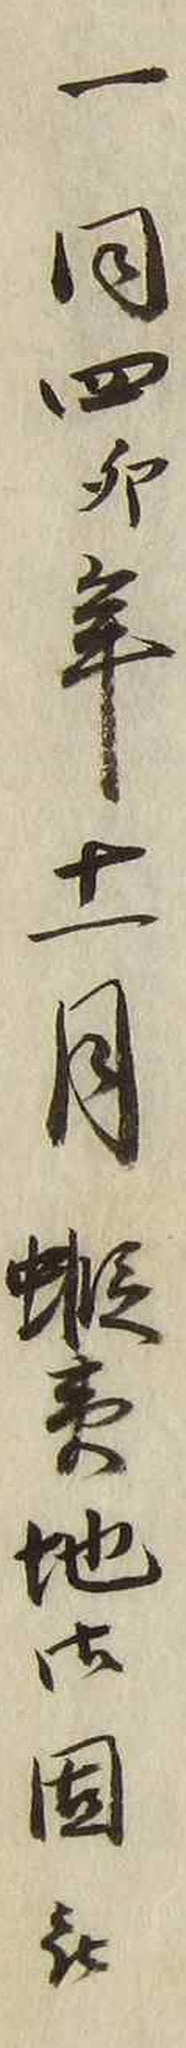一同四卯年十一月蝦夷地御固被

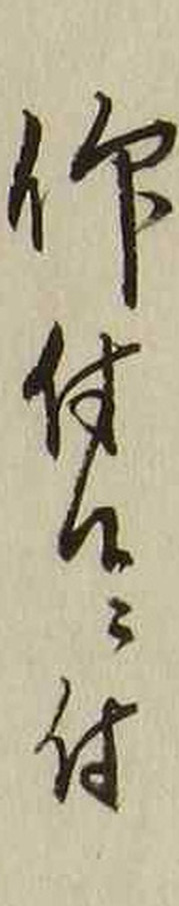仰付候に付
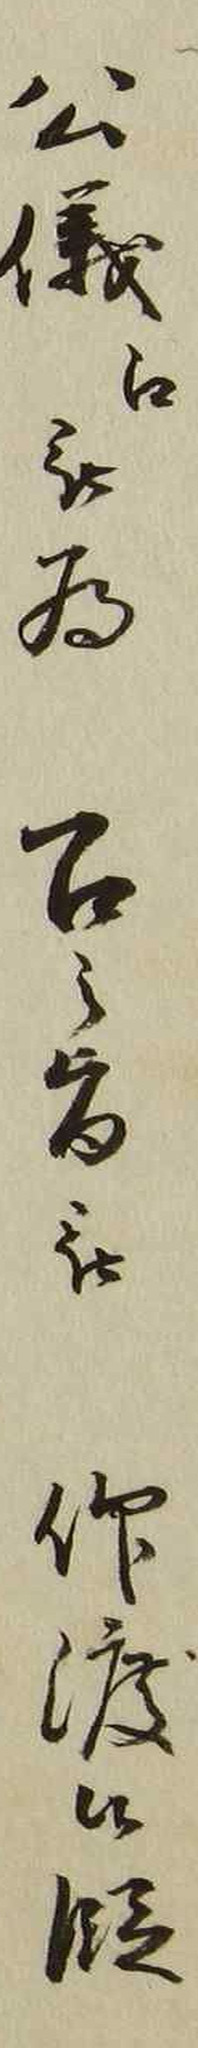公儀江被為召之旨被仰渡候段
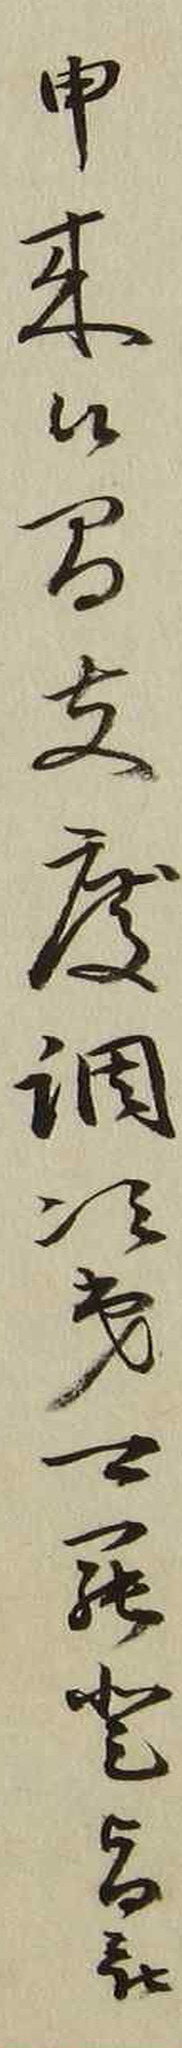申来候間支度調次第可罷登旨被
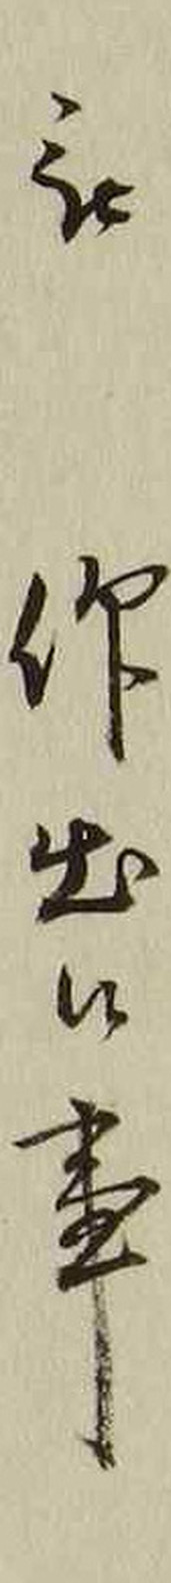被仰出候事
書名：諸士系譜　巻之125　た之部1
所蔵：会津若松市立会津図書館
